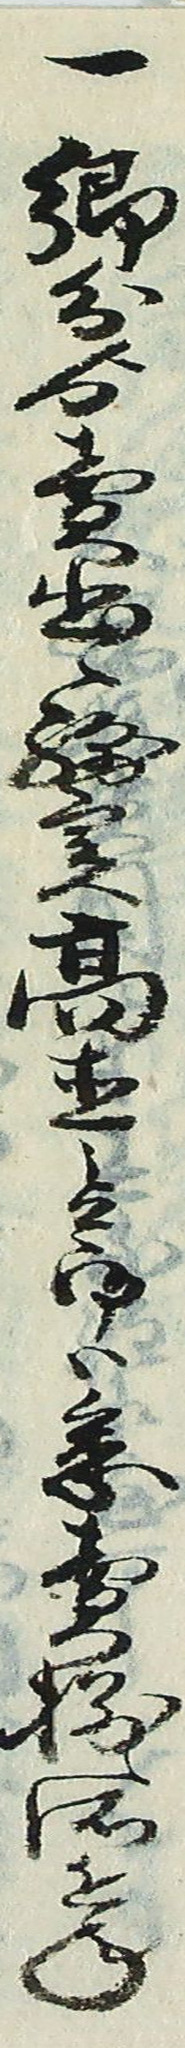一郷分ゟ売出候綿実高直之節は悉売捌候所近年
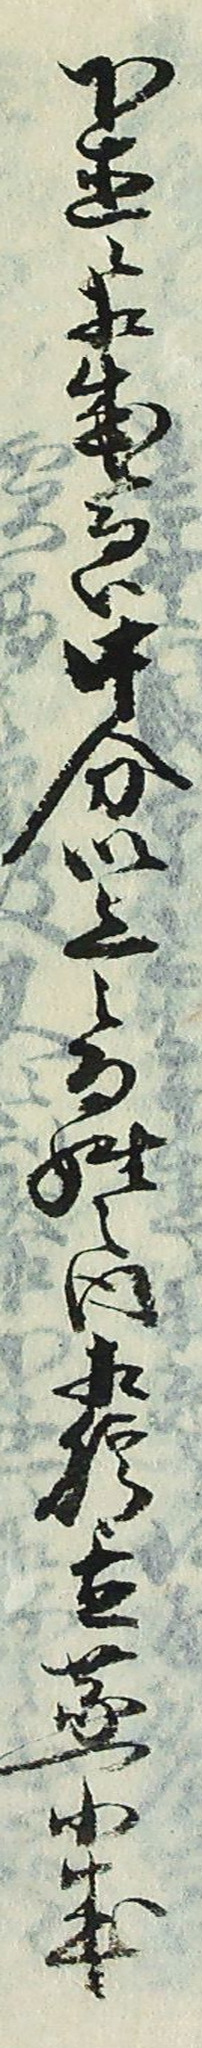下直に相成候而は中分以上之百姓之内相貯置蒸小成
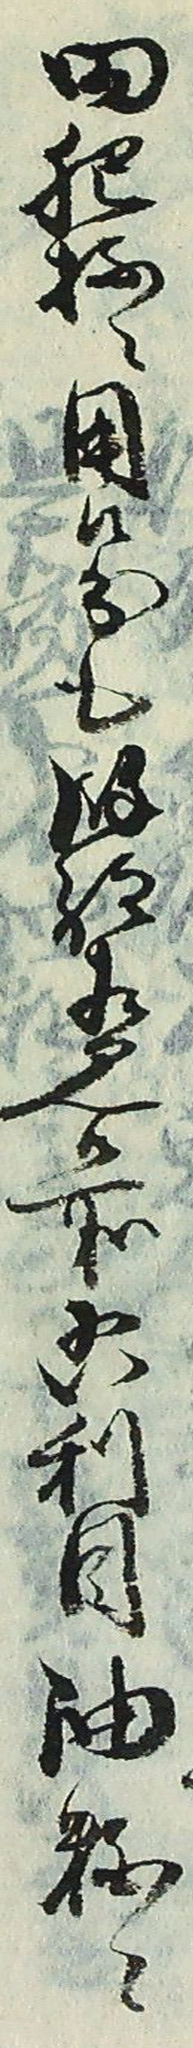田肥抔に用候分も余程相見候所右利目油粕に
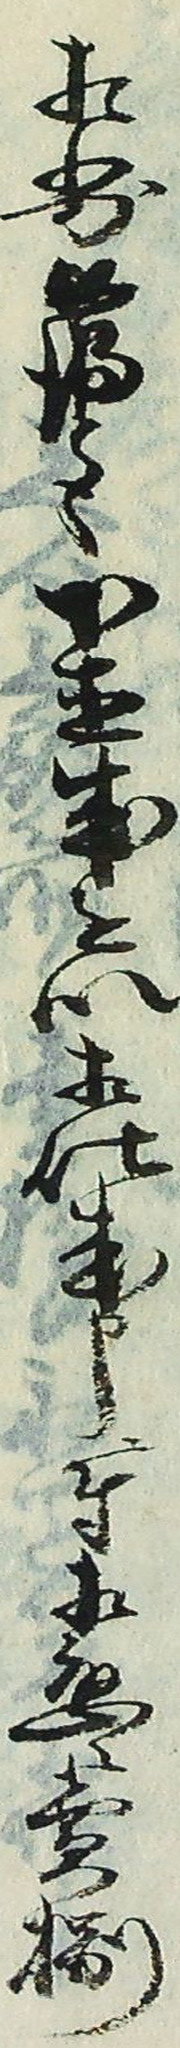相劣候得共とも下直成を以相仕成申に付相応に売捌
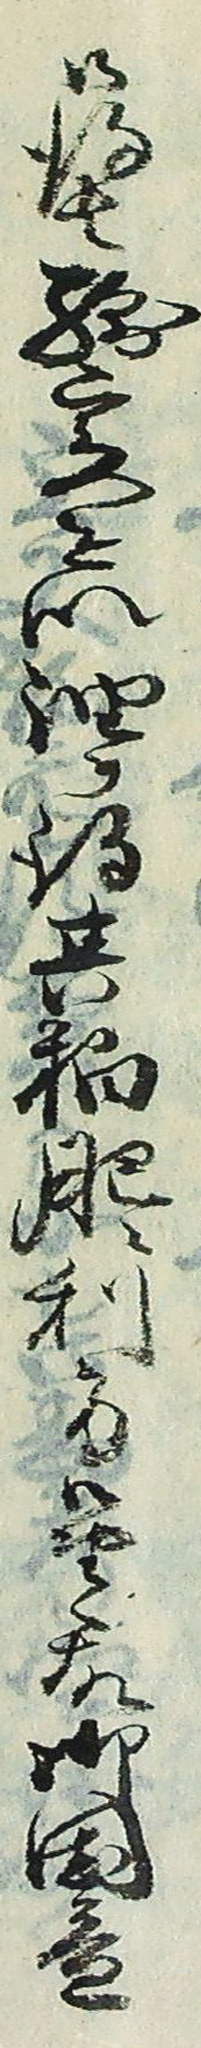候得者綿実を以油を得共粕肥に利方御坐候故
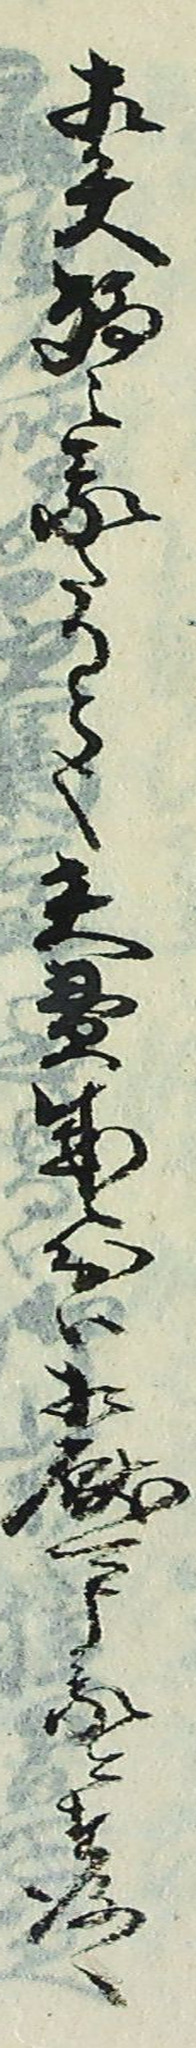相失聊之義たるとも失費成候分は相厭可申義に奉存候
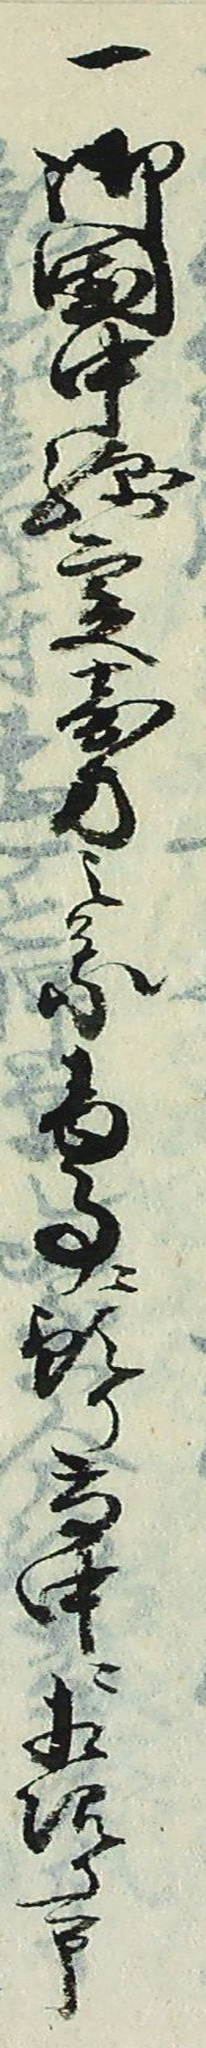一御国中綿実寄方之義商事に預り市中に相限り可申
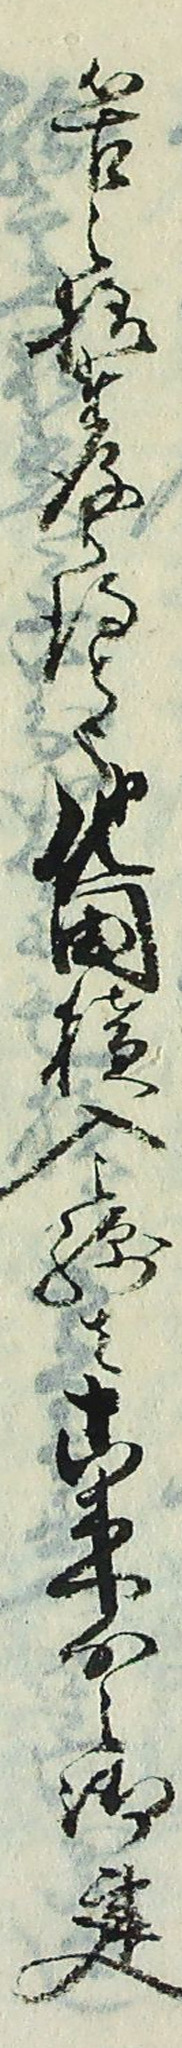筈之様奉存候得とも他国積入之綿者古来ゟ之御建
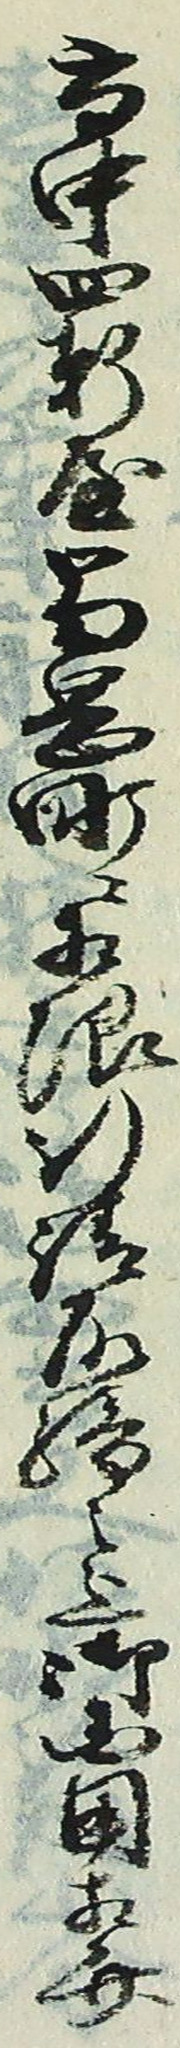市中四軒屋富岡町に相限引請取締之上御国用相弁
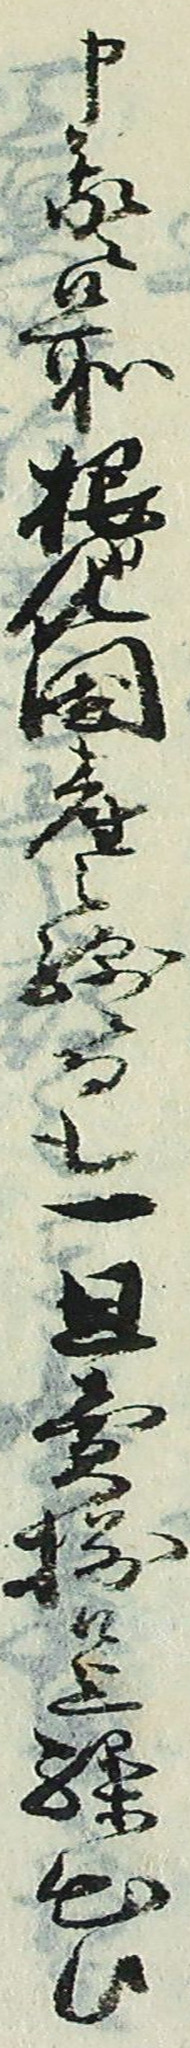申義に候所根他国産之綿に而も一旦売捌候上繰出候
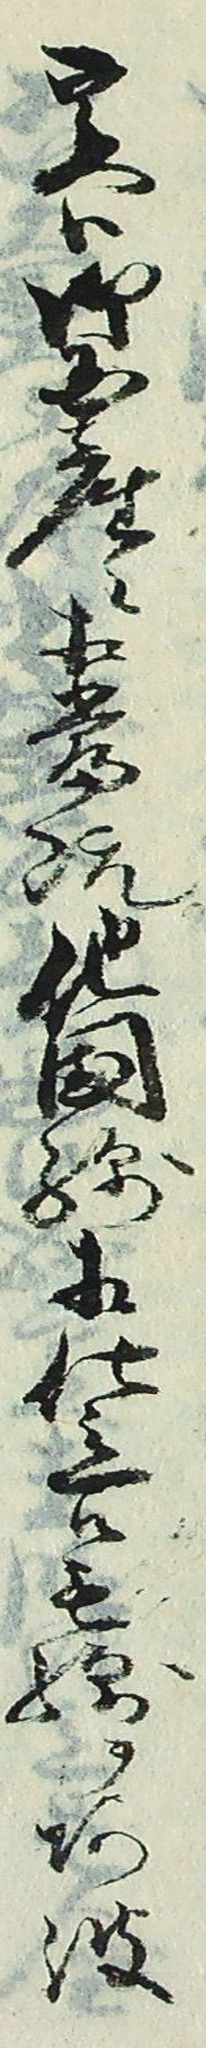実は御国産に相当既他国綿相仕立候毛綿を阿波
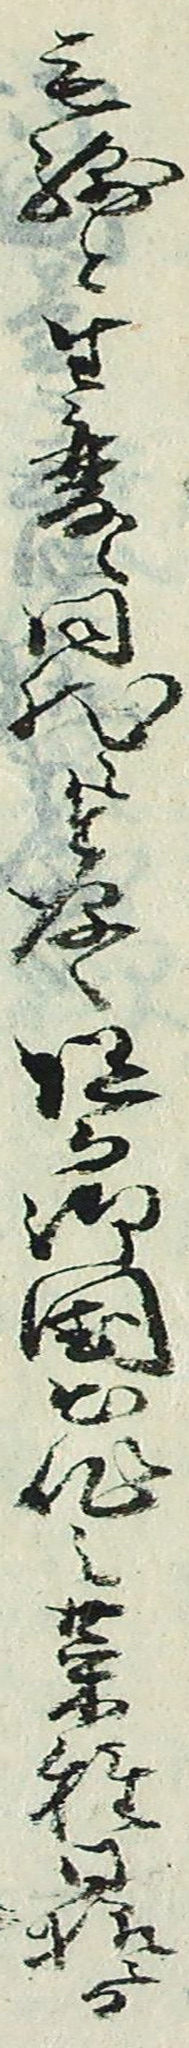毛綿と生変に同然と奉存候随而御国出作之菜種同様に而
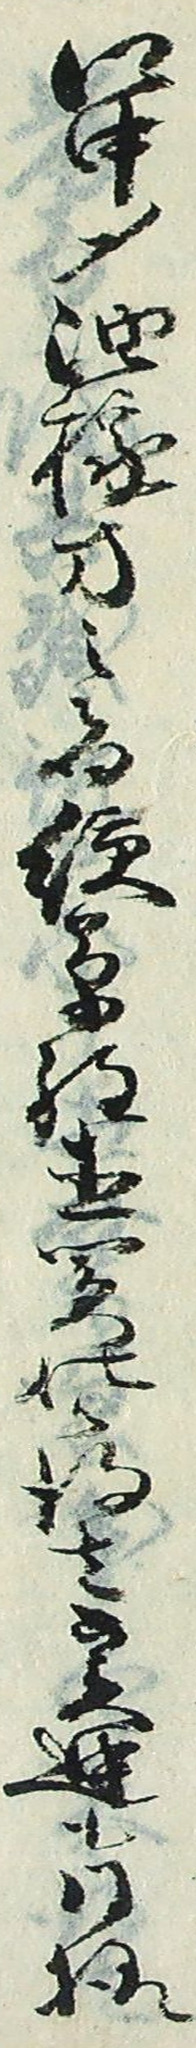郷中〆油稼方之者絞草程直買仕候得者実迚も同様
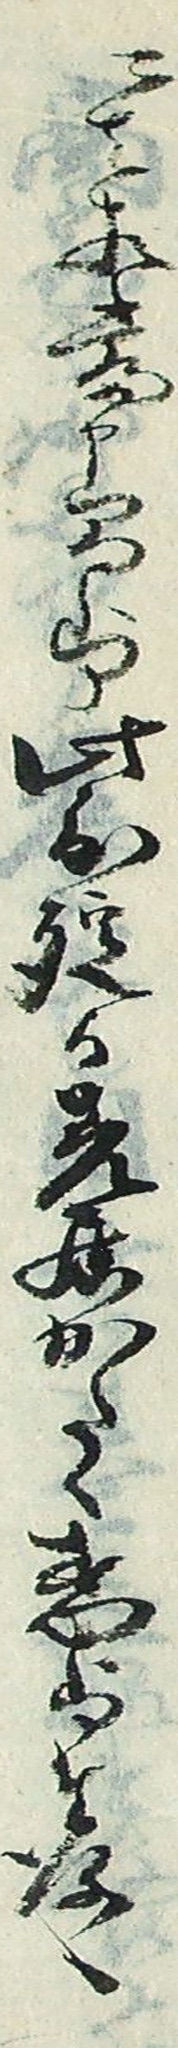に者相当申間布此度聢と差居かたく惑布奉存候

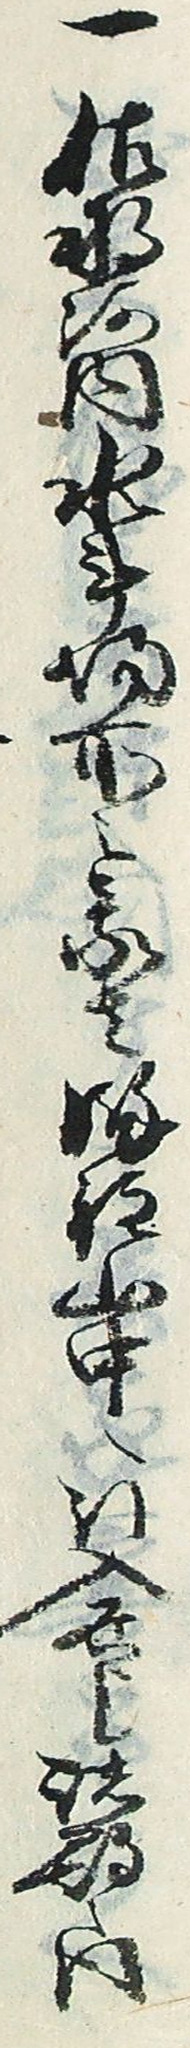一佐那河内水車場所之義者余程山中へ引入居申諸郡之内
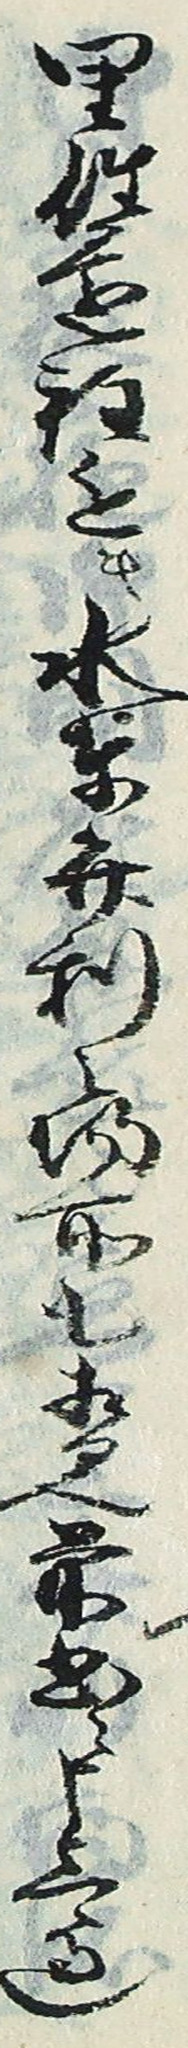里往還程近き水車弁利之場所も相見前書に申上候通
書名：油稼御取究ニ附御箇條書テ以被仰渡南北同役申談御答書控
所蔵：鳴門教育大学 Naruto University of Education
